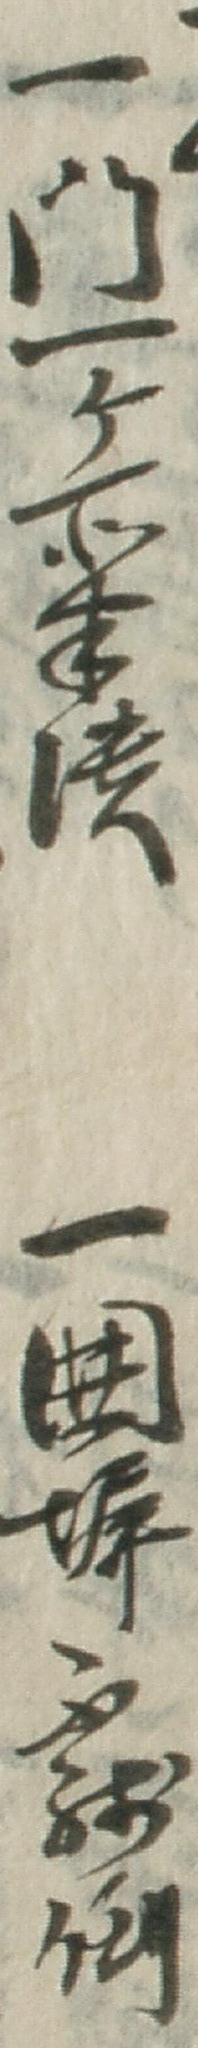一門一ヶ所半潰一囲塀不残倒
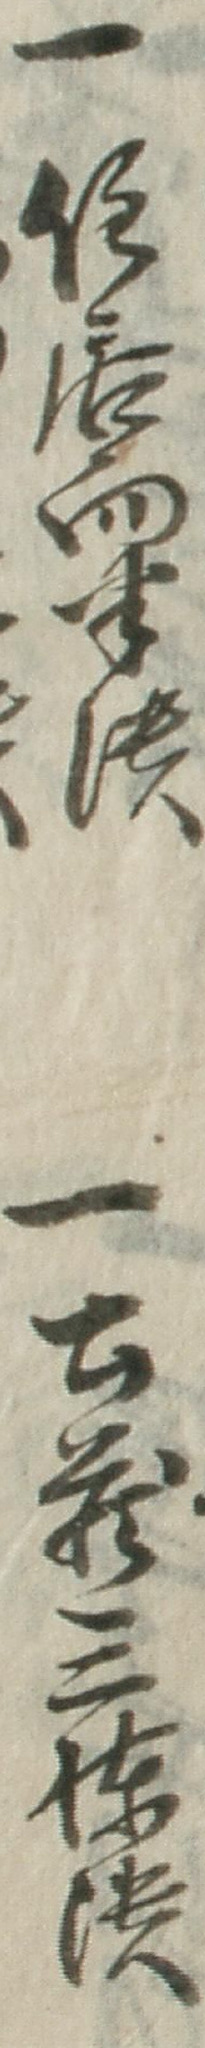一住居向半潰一土蔵三棟潰
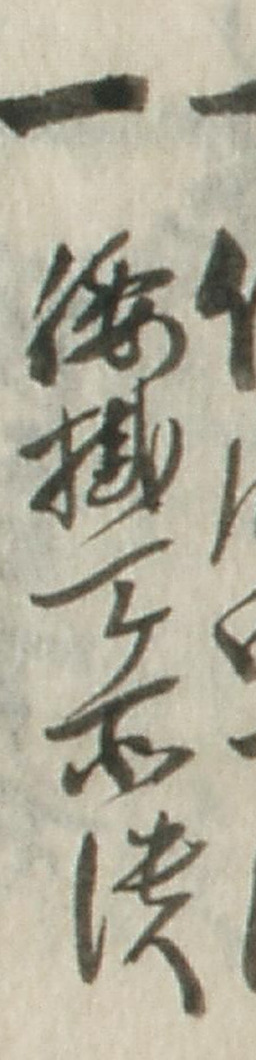一腰掛一ヶ所潰
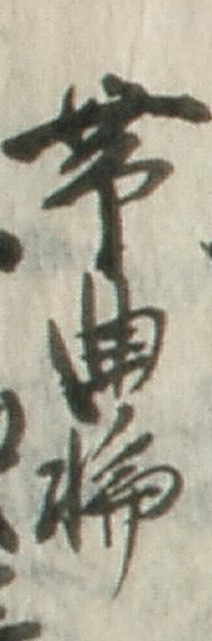帯曲輪
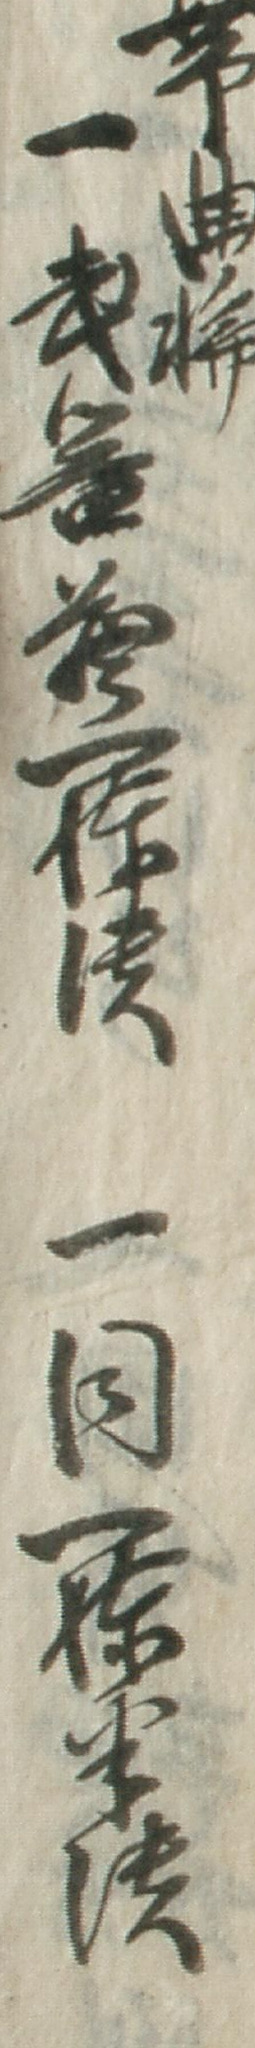一武器蔵一棟潰一同一棟半潰

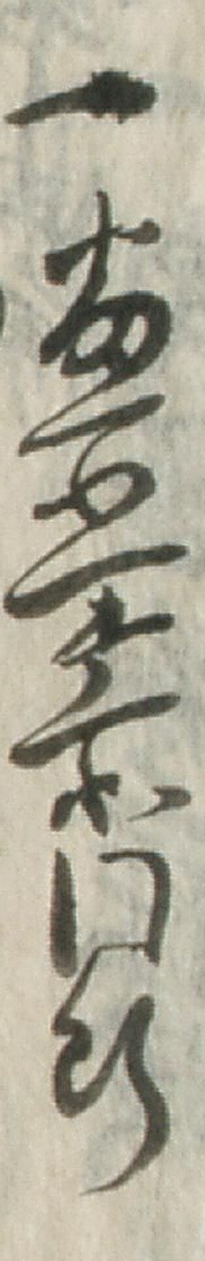一番所一ヶ所半潰
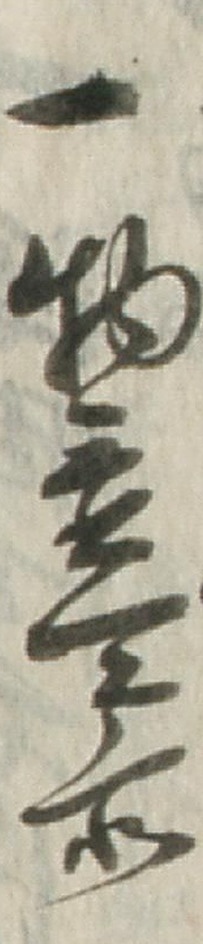一物置一ヶ所
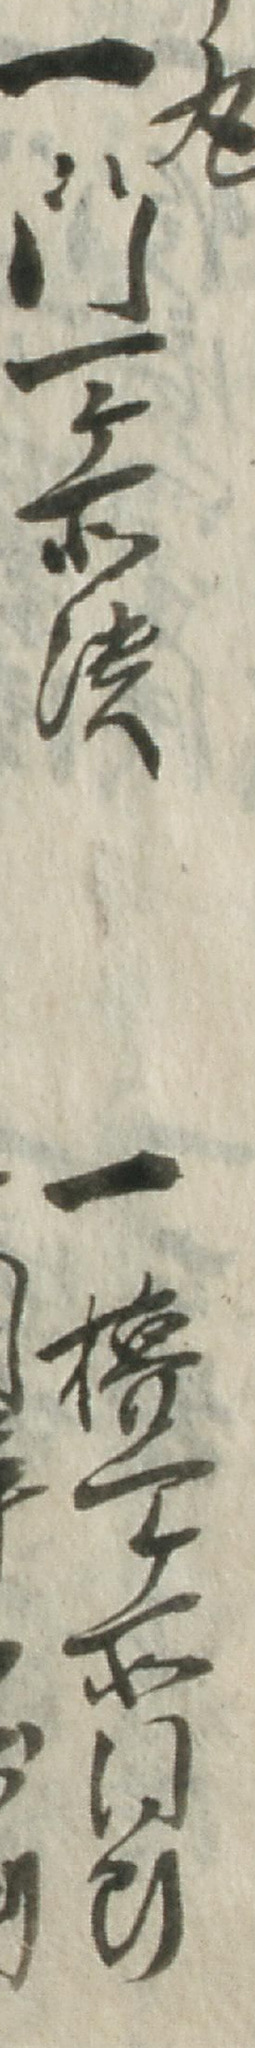一門一ヶ所潰一櫓一ヶ所同断
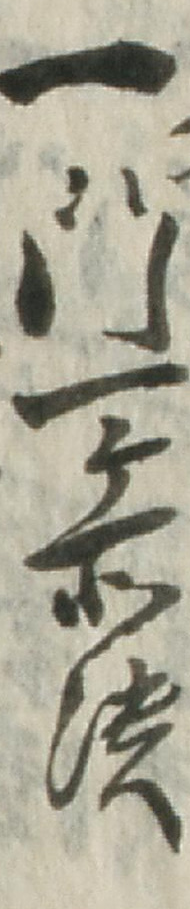一番所一ヶ所潰
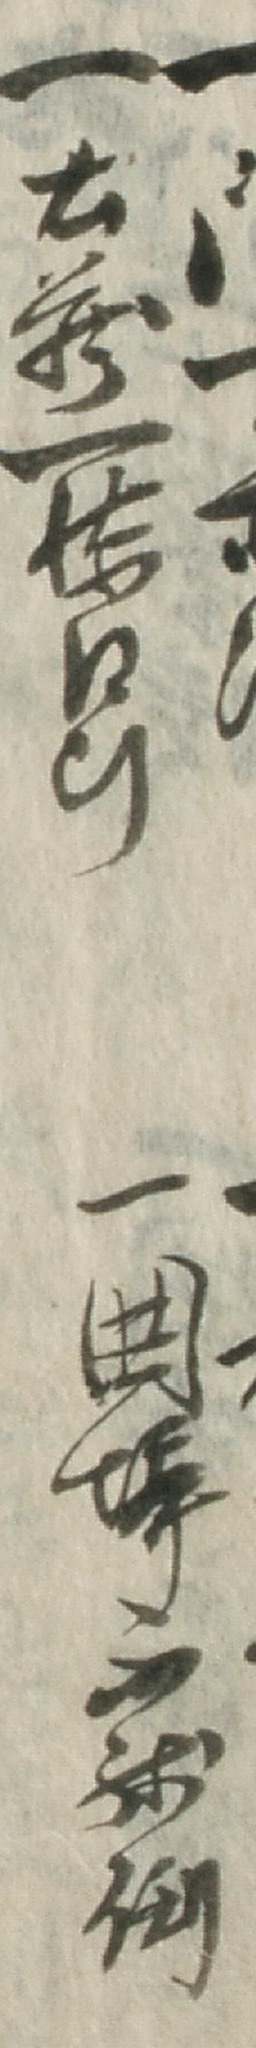一土蔵一棟同断一囲塀不残倒
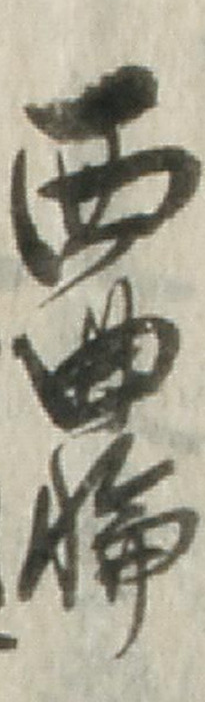西曲輪
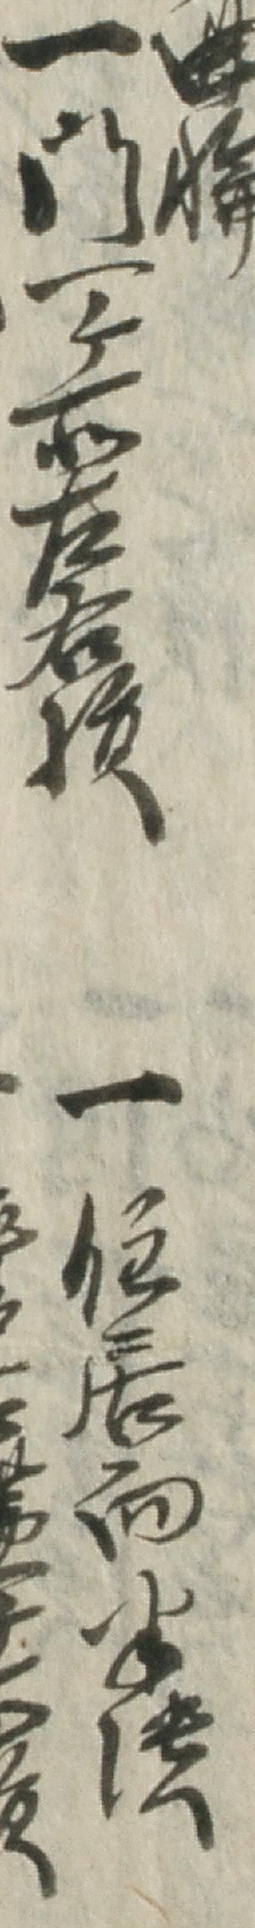一門一ヶ所左右損一住居向半潰
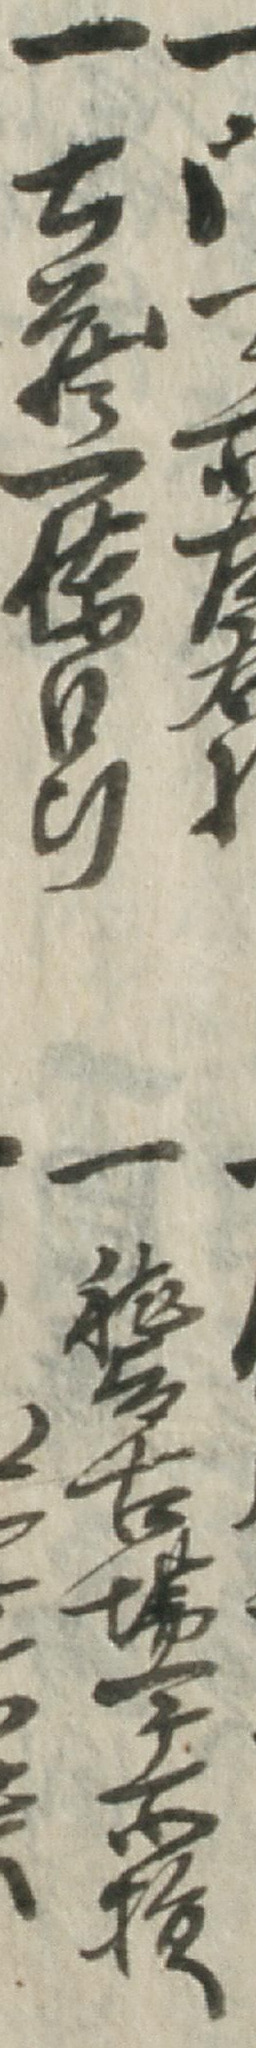一土蔵一棟同断一稽古場一ヶ所損
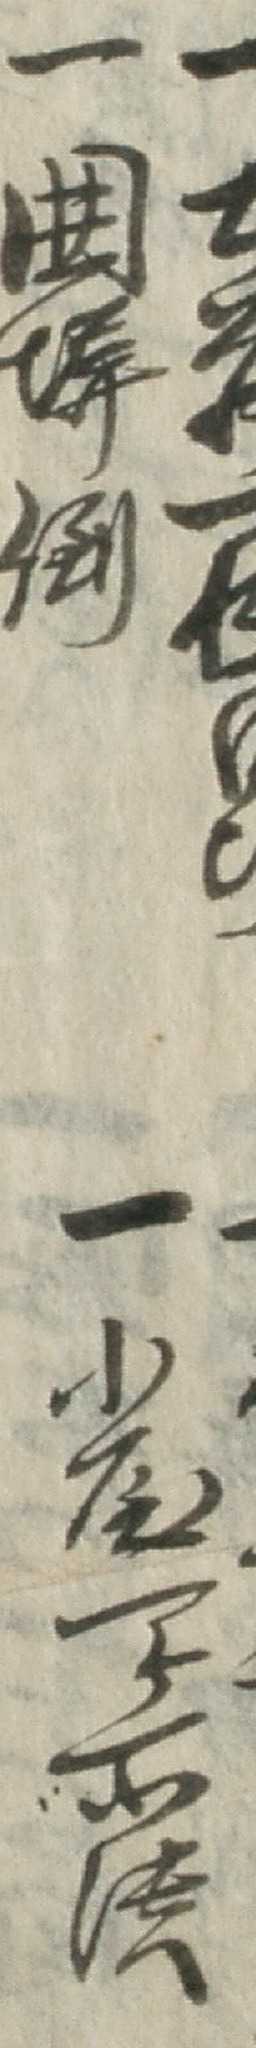一囲塀倒一小屋一ヶ所潰
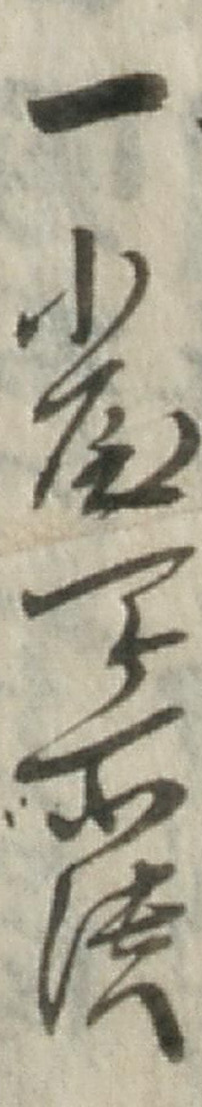一番所一ヶ所潰
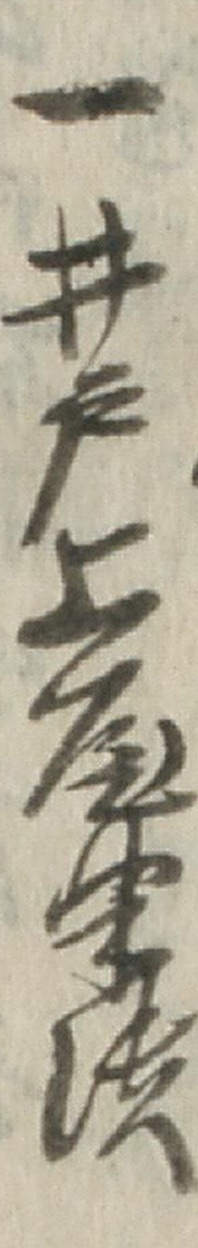一井戸上屋半潰
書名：信濃國地震實録記
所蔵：東京大学地震研究所図書室 Earthquake Research Institute Library, The University of Tokyo, JAPAN
